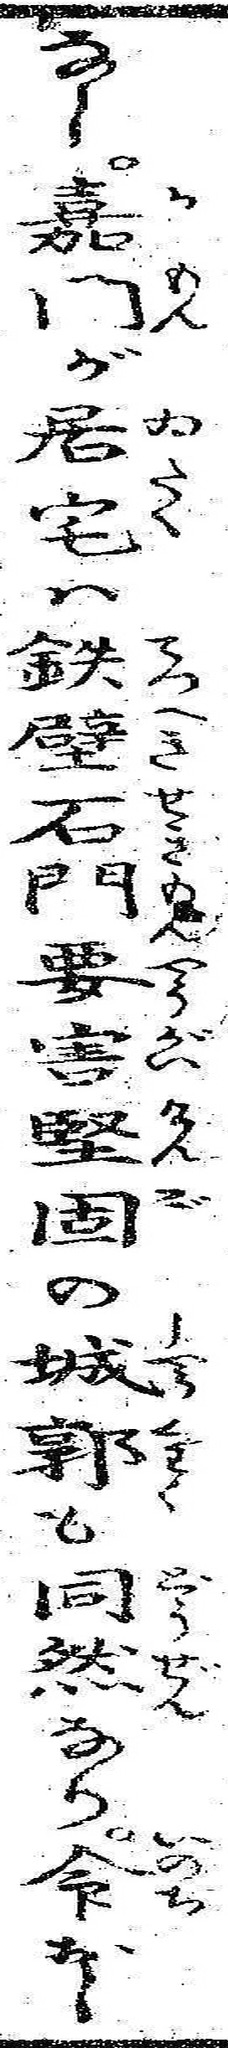なし。嘉門が居宅は鉄壁石門要害堅固の城郭も同然なり。命おし
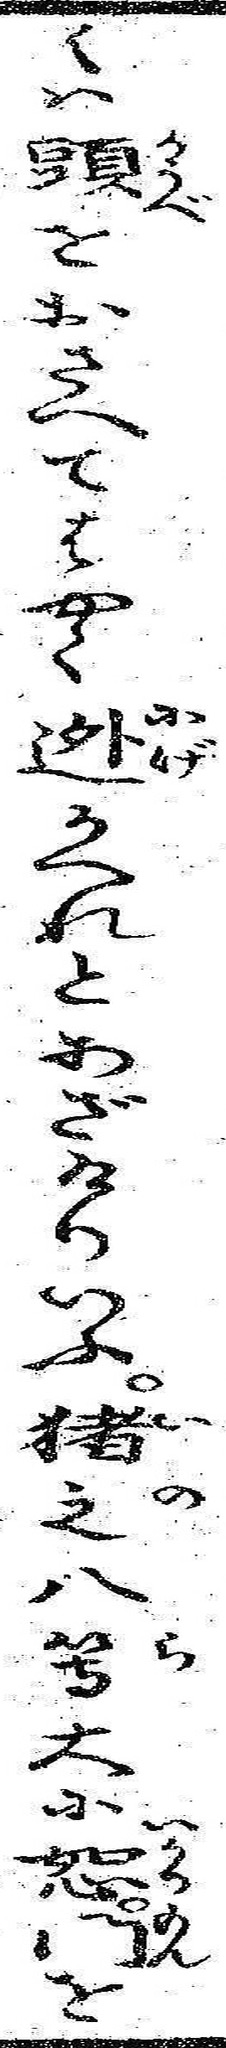くは頭をおさへてはやく逃かへれとあざけりいふ。猪之八等大に恕。門を
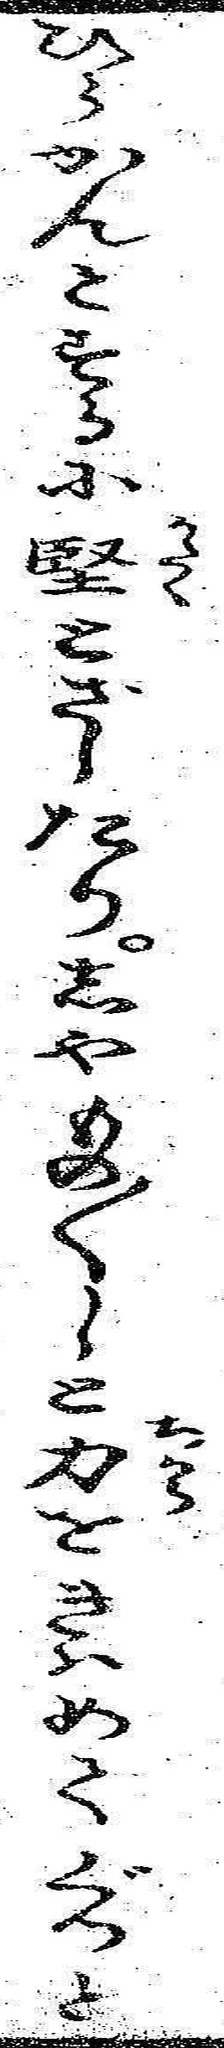ひらかんとするに堅とざしたり。しやもの〳〵しと力をきはめてぐつと
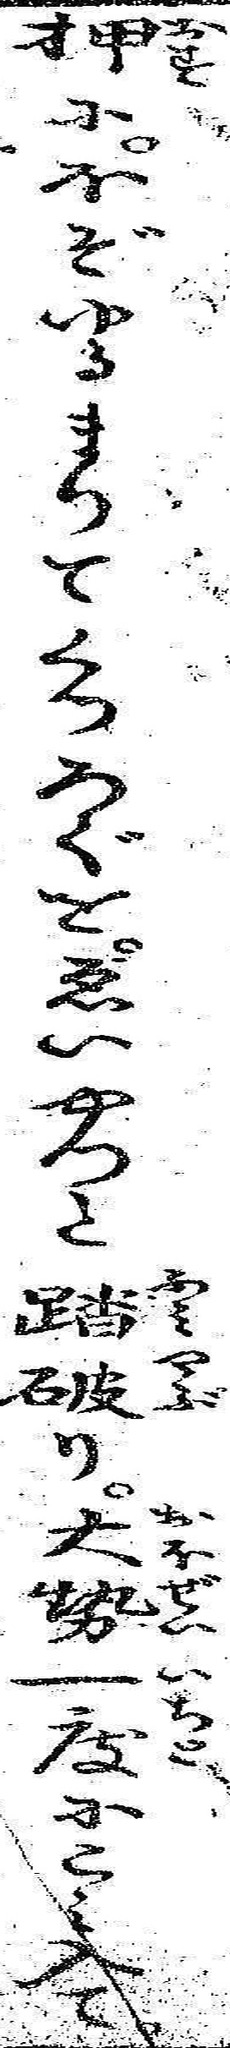押に。ほぞゆるまりてくつろぐを。ゑいやつと踏破り。大勢一度にこみ入て。
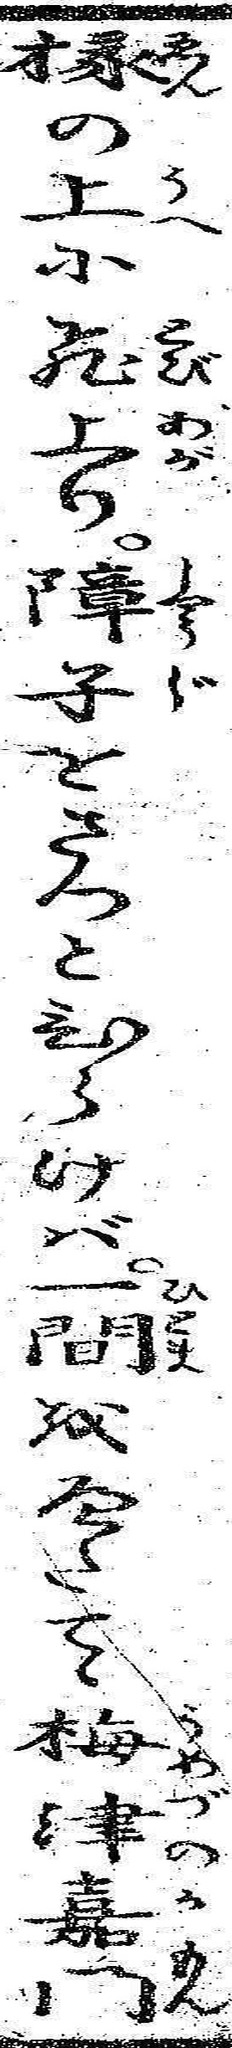椽の上に飛上り。障子をさつとひらけば。一間をへたてゝ梅津嘉門

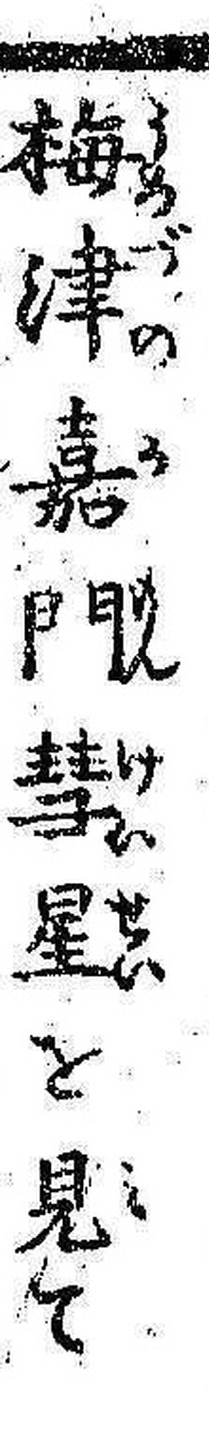梅津嘉門彗星を見て
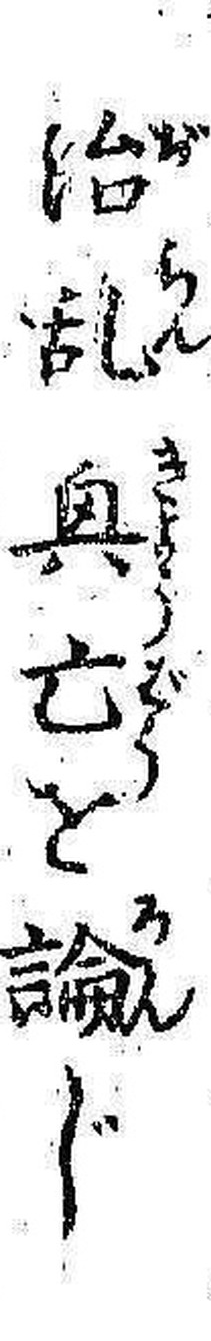治乱興亡を論じ
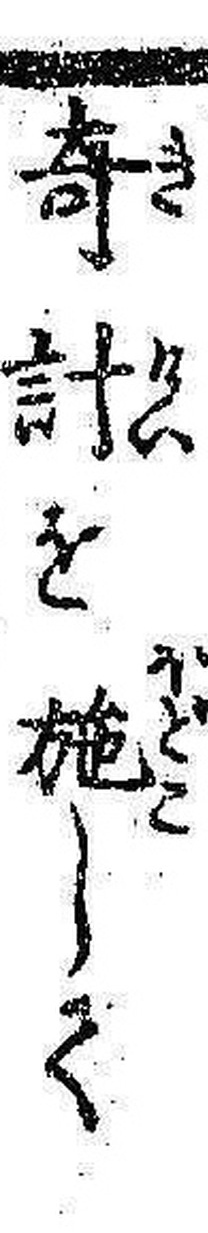奇計を施して
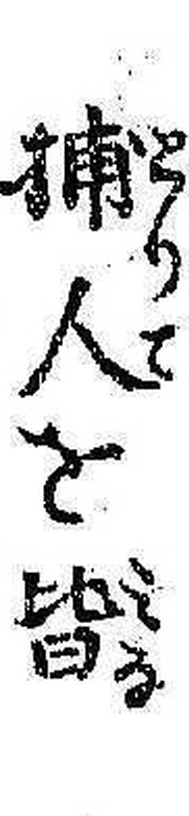捕人を皆
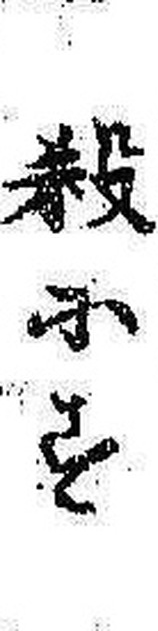殺にす

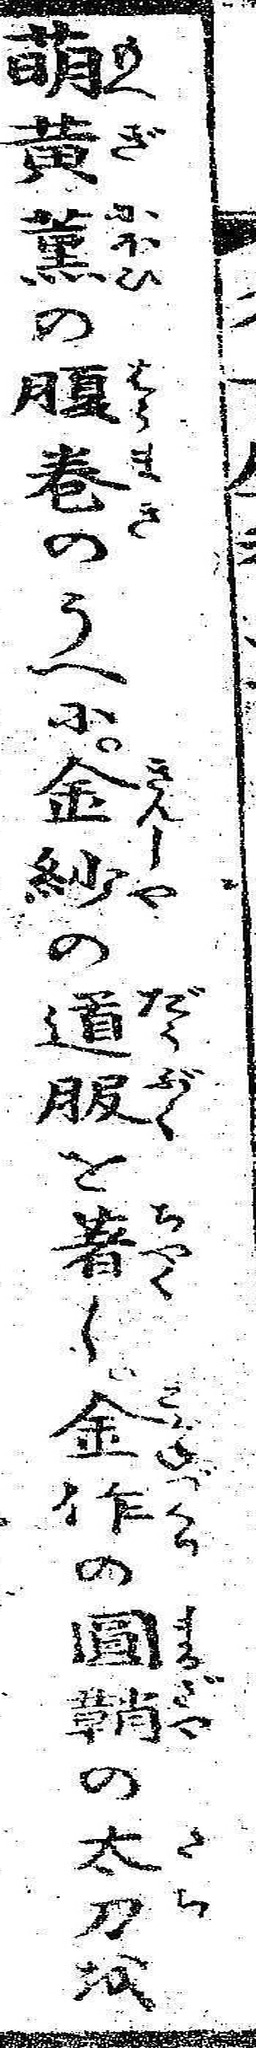萌黄薫の腹巻のうへに。金紗の道服を著し。金作の円鞘の太刀を
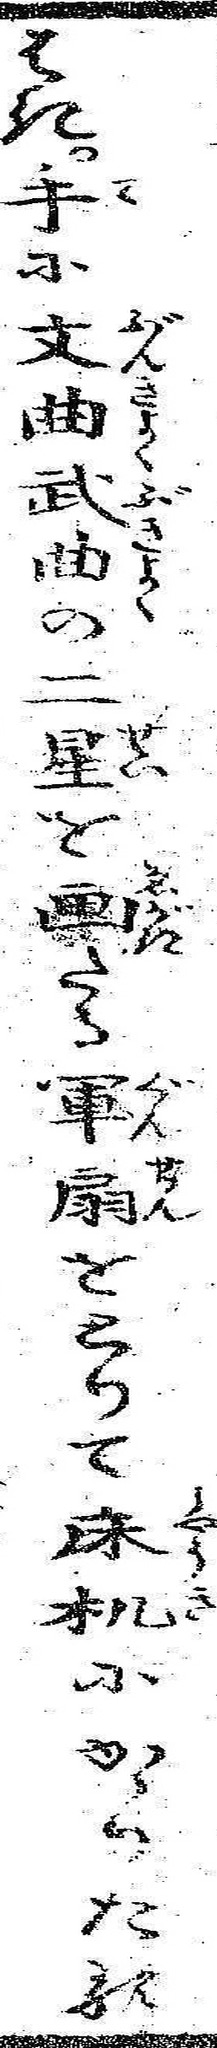はき。手に文曲武曲の二星を画たる軍扇をとりて床机にかゝりたる
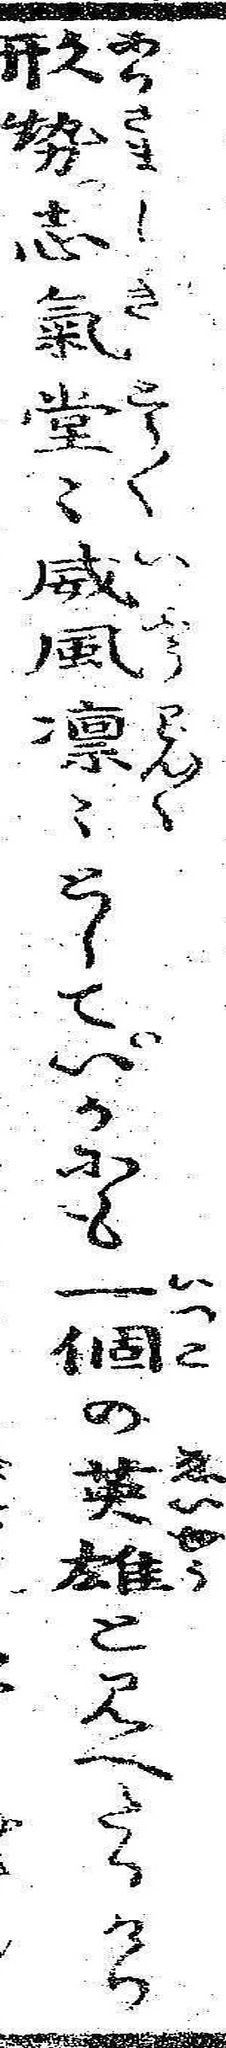形勢。志気堂々威風凛々として。いかにも一個の英雄と見へたりけり
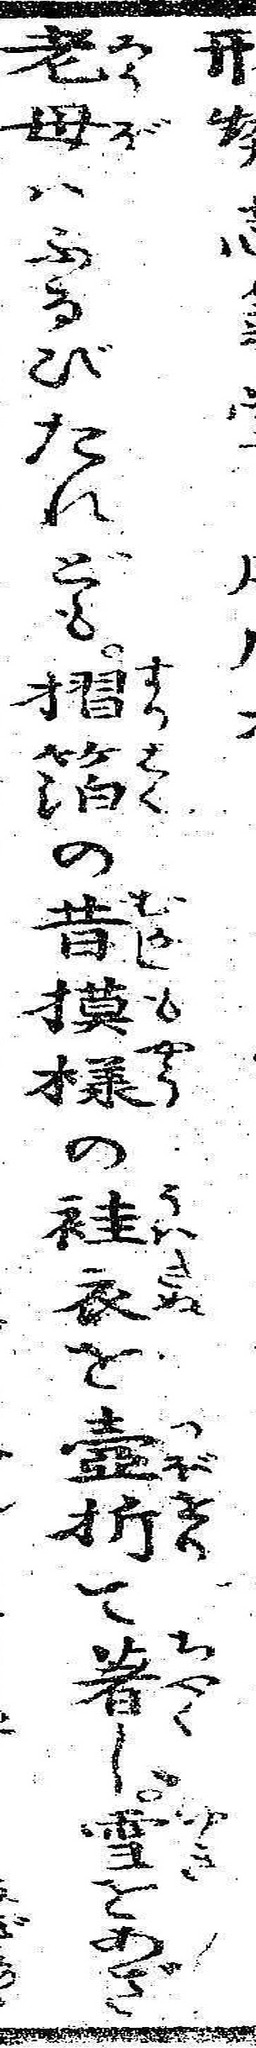老母はふるびたれども。摺箔の昔模様の袿衣を壷折て著し。雪をあざ
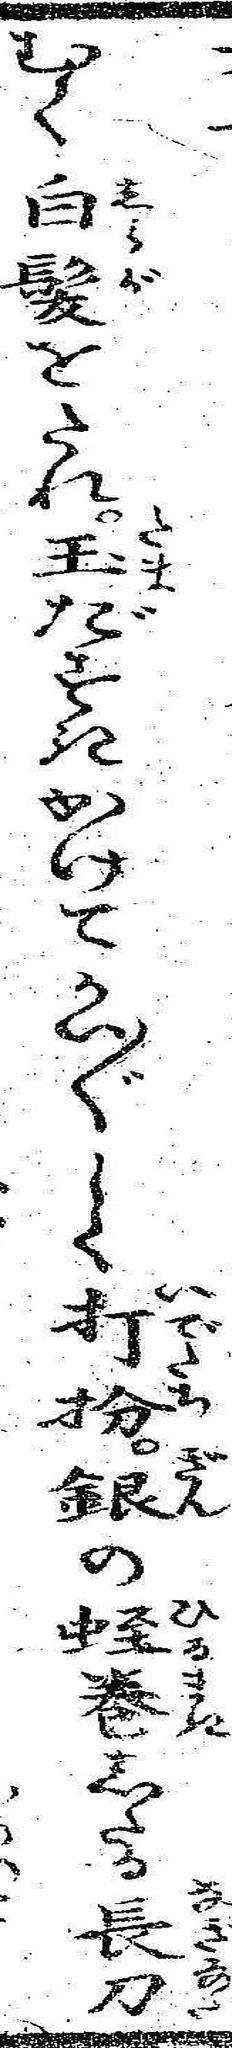むく白髪をたれ。玉だすきかけてかい〴〵しく打扮。銀の蛭巻したる長刀
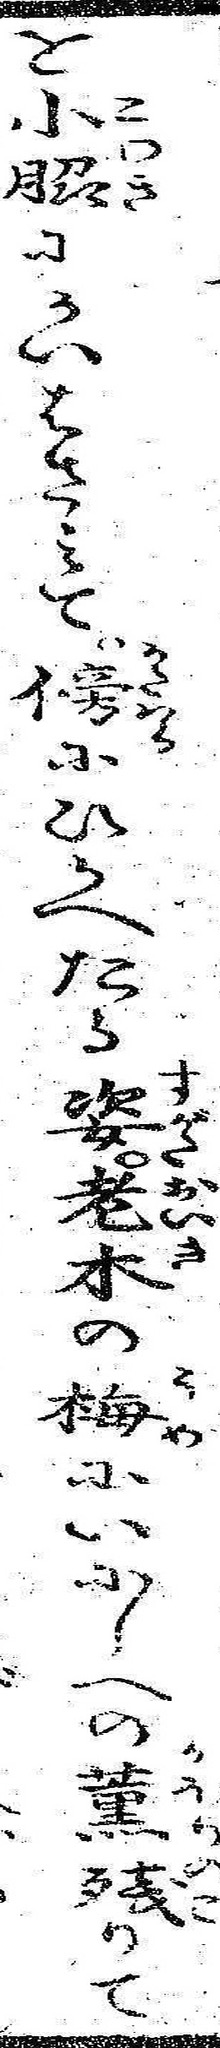を小脇にかいはさみて。傍にひかへたる姿。老木の梅にいにしへの薫残りて
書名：昔話稲妻表紙
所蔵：国文学研究資料館
